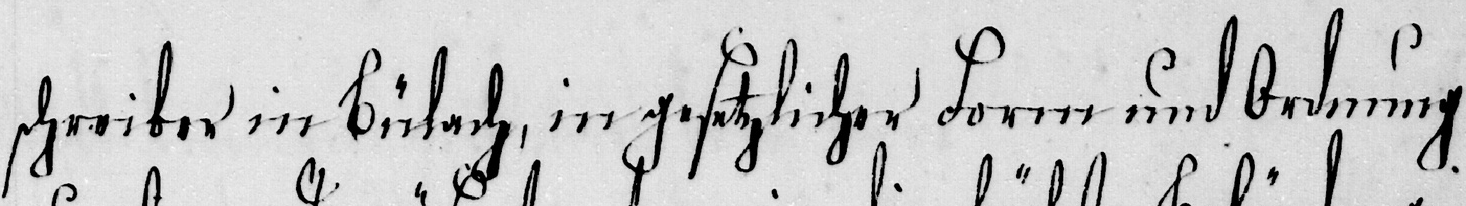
schreiber in Bülach, in gesetzlicher Form und Ordnung
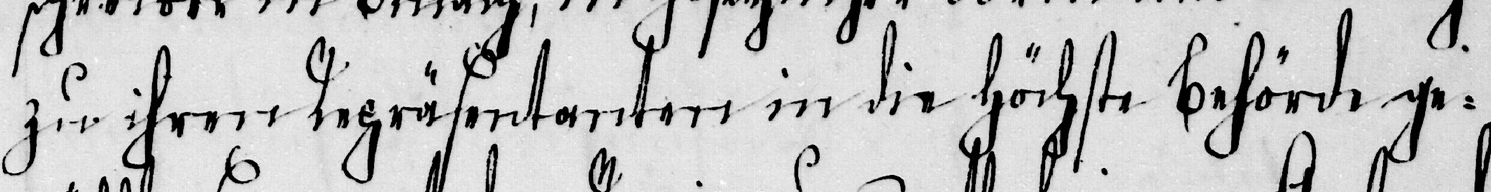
zu ihren Repräsentanten in die höchste Behörde ge¬
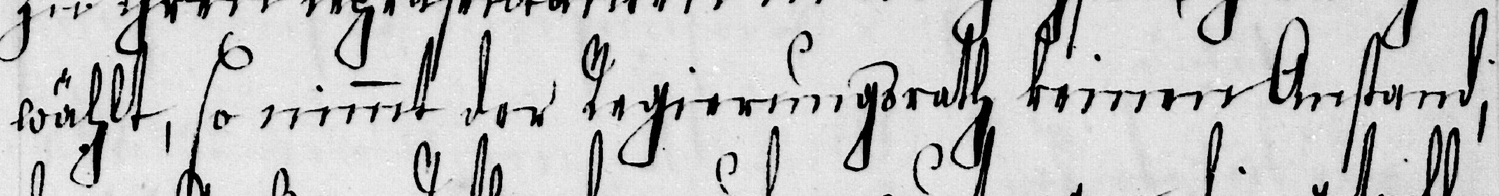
wählt, so nimmt der Regierungsrath keinen Anstand,
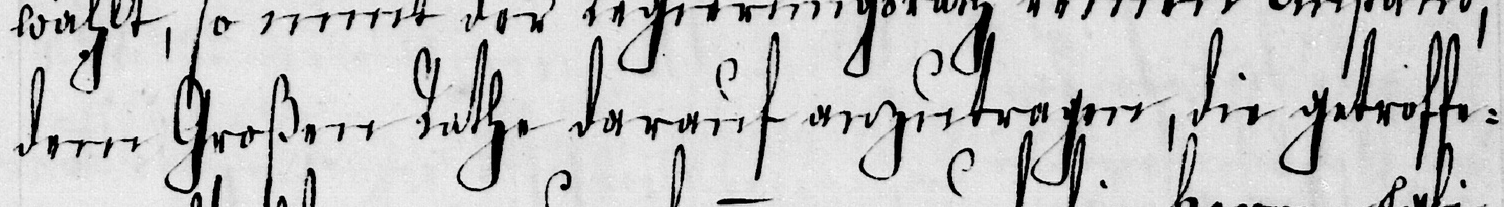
dem Großen Rathe darauf anzutragen, die getrof¬
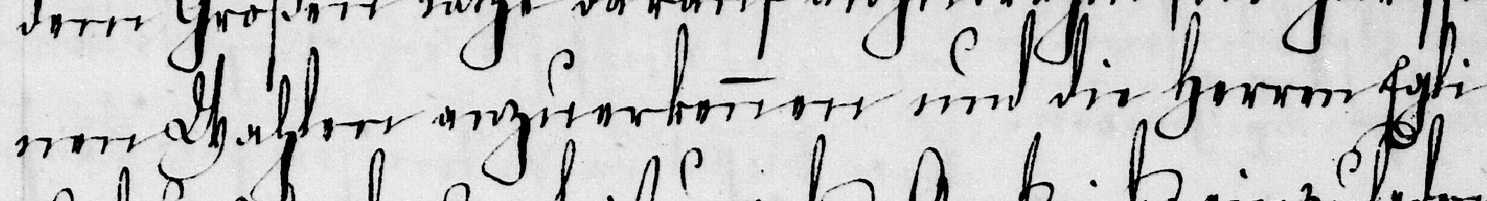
nen Wahlen anzuerkennen und die Herren Egli
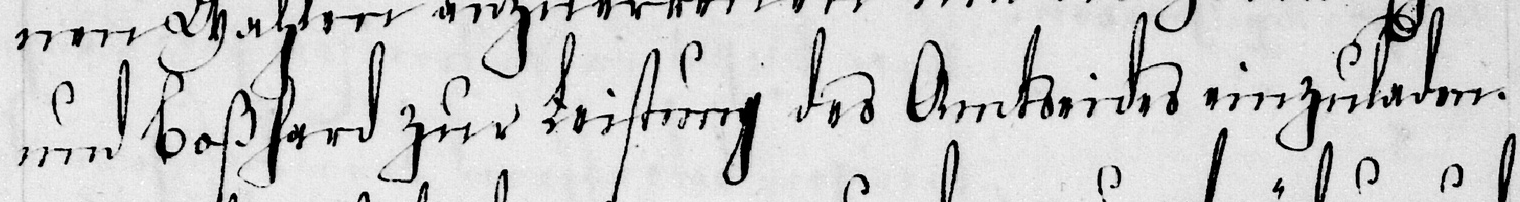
und Boßhard zur Leistung des Amtseides einzuladen.
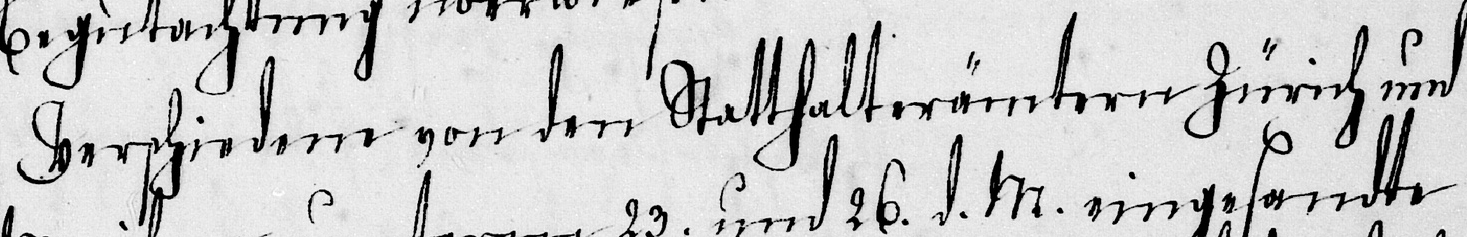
Verschiedene von den Statthalterämtern Zürich und
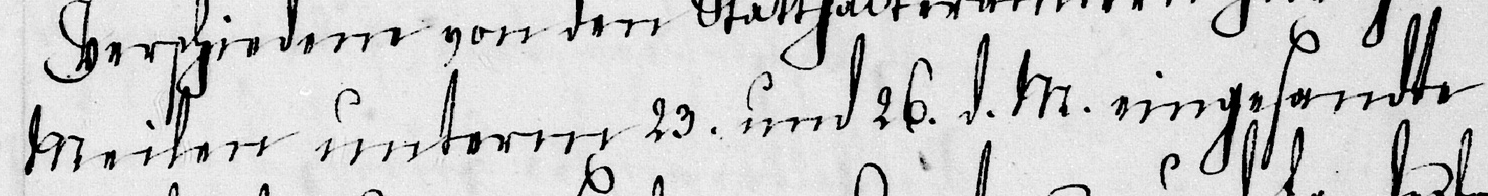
Meilen unterm 23. und 26. d. M. eingesandte
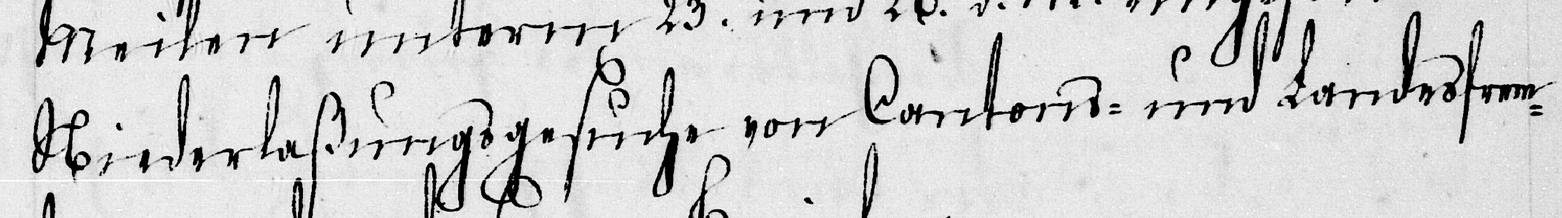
Niederlaßungsgesuche von Cantons- und Landesfrem¬
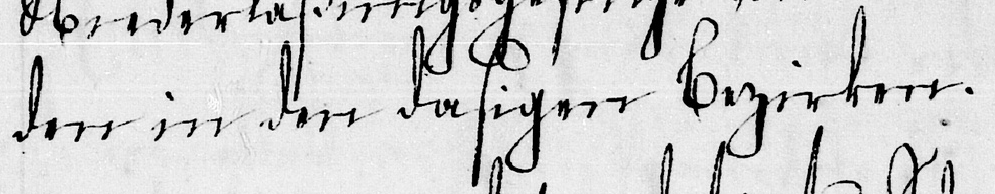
den in den dasigen Bezirken.
